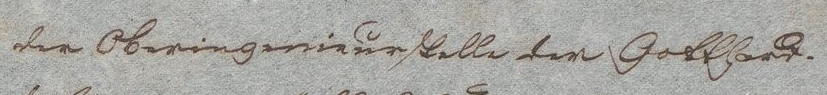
der Oberingenieurstelle der Gotthard-
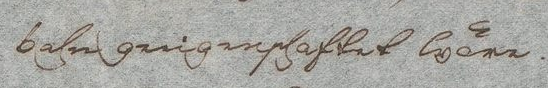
bahn geeigenschaftet wäre.
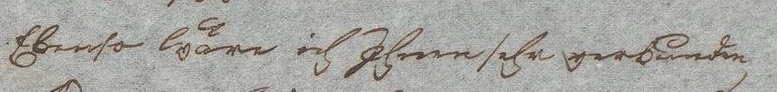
Ebenso wäre ich Ihnen sehr verbunden,
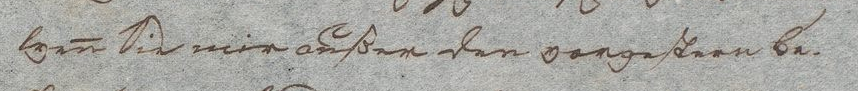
wenn Sie mir außer den vorgestern be-
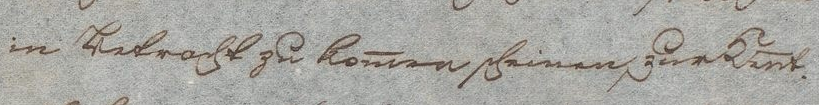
in Betracht zu kommen scheinen, zur Kennt-
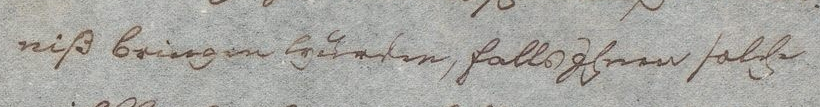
niß bringen würden, falls Ihnen solche
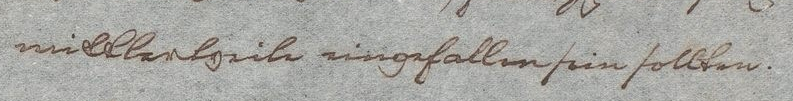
mittlerweile eingefallen sein sollten.
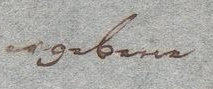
ergebene
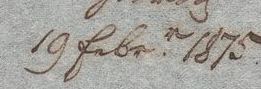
19 Febrr 1875.
